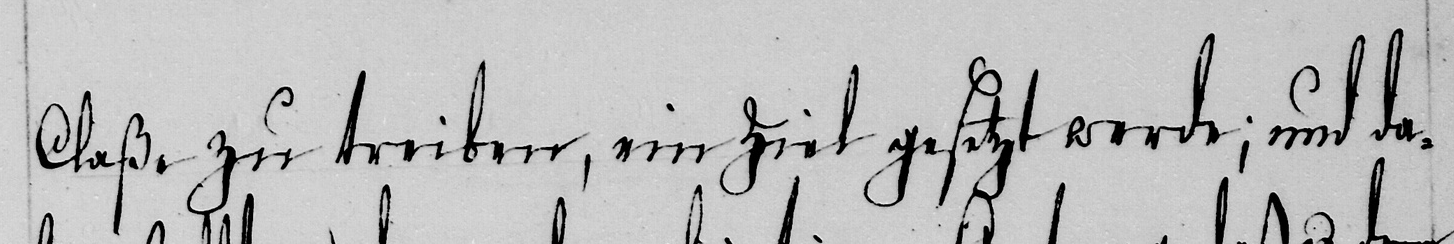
Claße zu treiben, ein Ziel gesetzt werde; und da¬
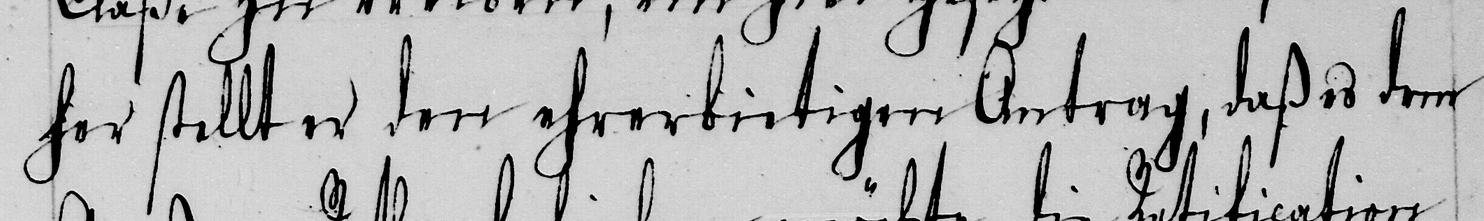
her stellt er den ehrerbietigen Antrag, daß es dem
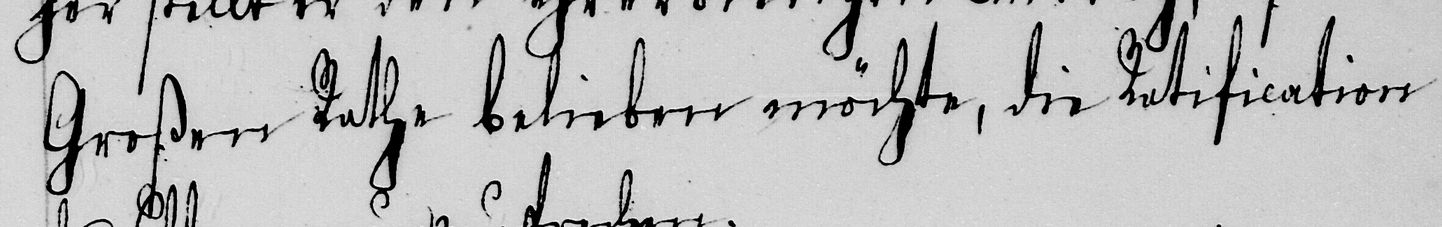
Großen Rathe belieben möchte, die Ratification
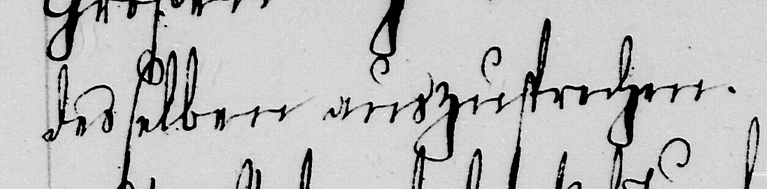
desselben auszusprechen.
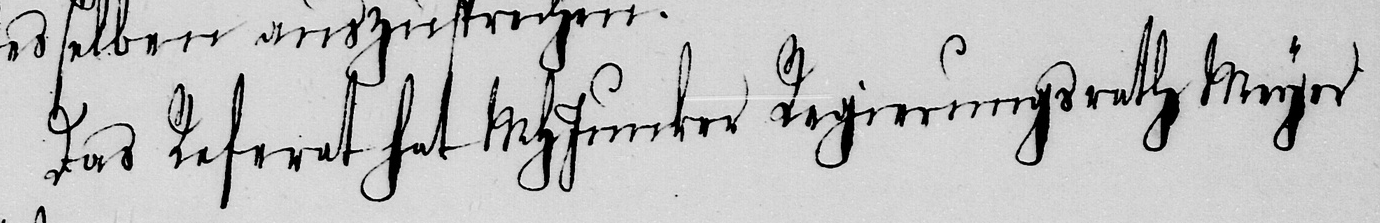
Das Referat hat MHJunker Regierungsrath Meyer
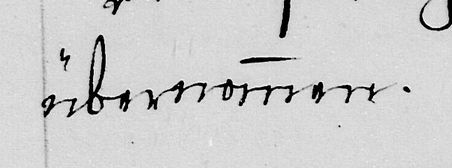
übernommen.
